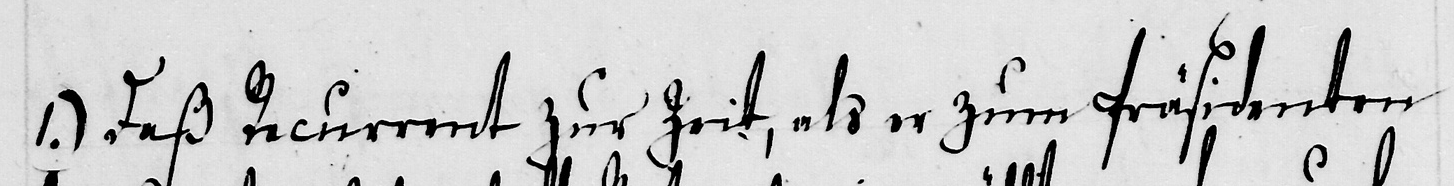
1.) Daß Recurrent zur Zeit, als er zum Präsidenten
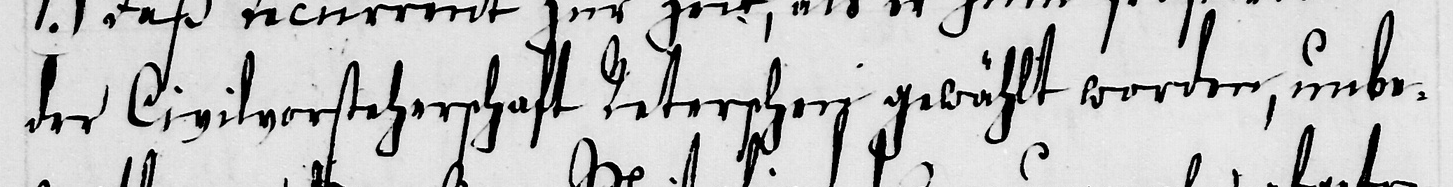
der Civilvorsteherschaft Reterschen gewählt worden, unbe¬
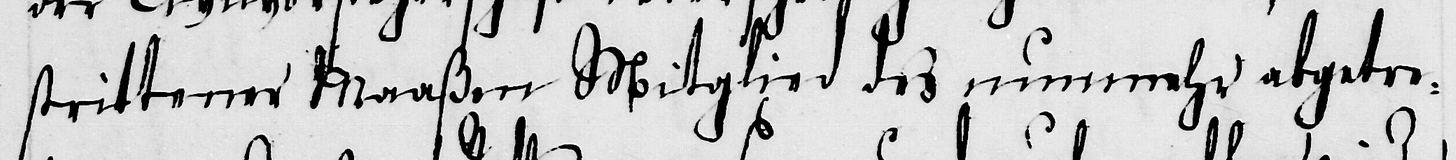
strittener Maaßen Mitglied des nunmehr abgetre¬
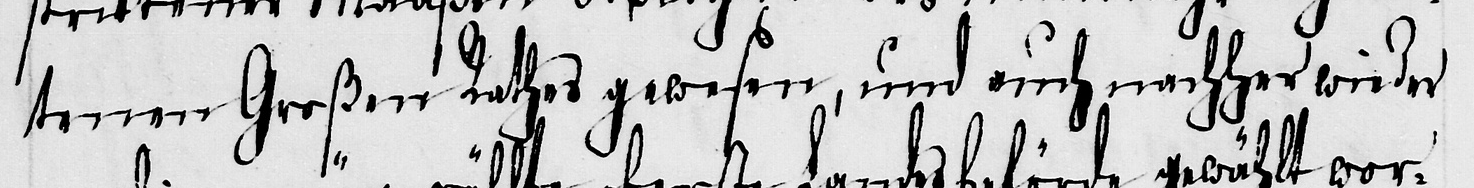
tenen Großen Rathes gewesen, und auch nachher wieder
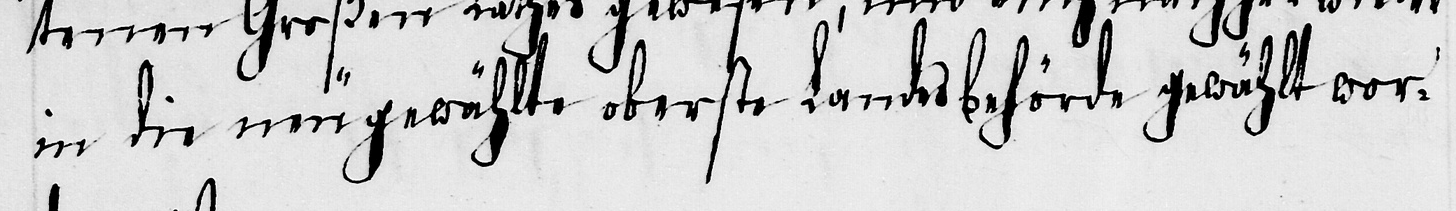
in die neugewählte oberste Landesbehörde gewählt wor¬
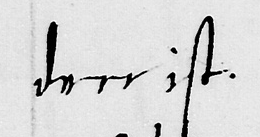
den ist.
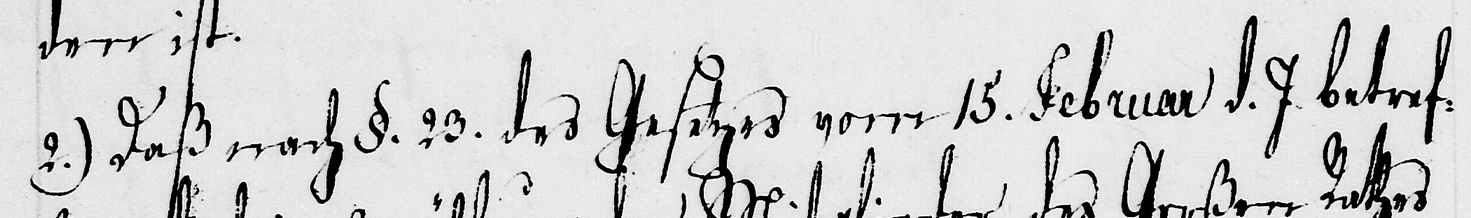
2.) Daß nach §. 23. des Gesetzes vom 15. Februar d. J. betref¬
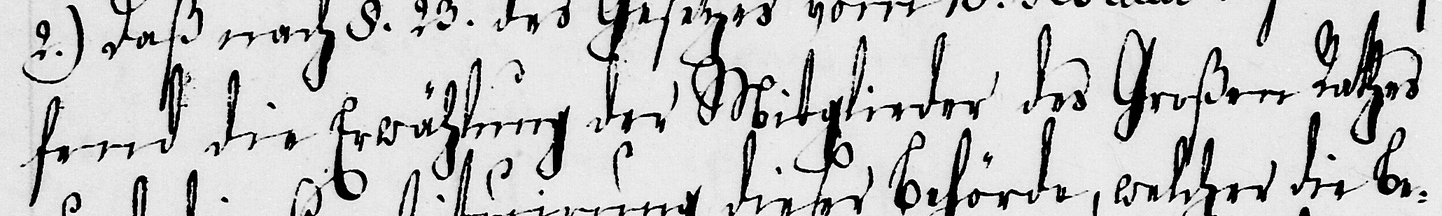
fend die Erwählung der Mitglieder des Großen Rathes
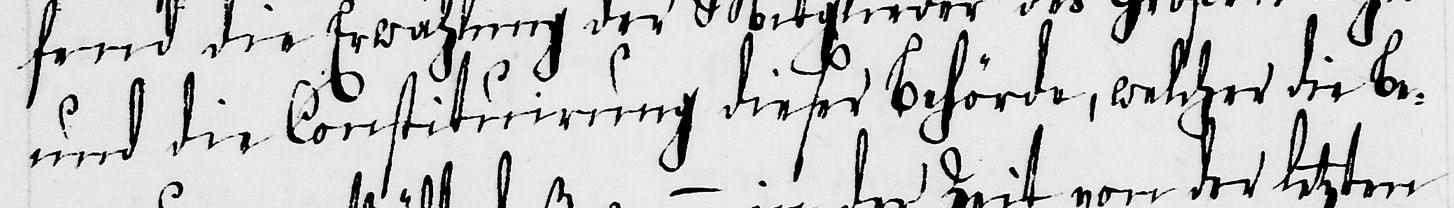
und die Constituirung dieser Behörde, welcher die Be¬
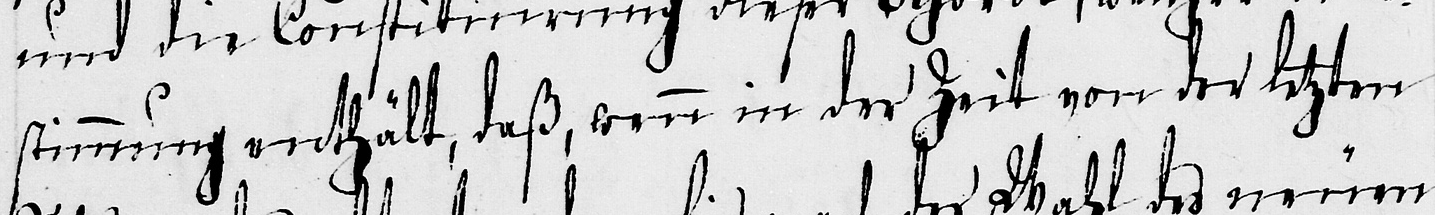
stimmung enthält, daß wenn in der Zeit von der letzten
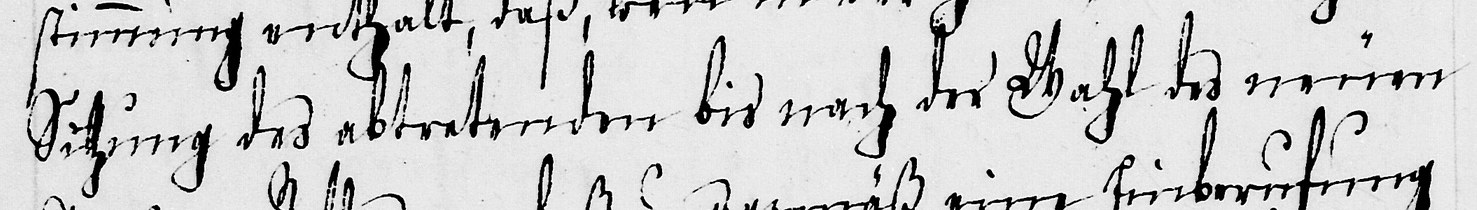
Sitzung des abtretenden bis nach der Wahl des neuen
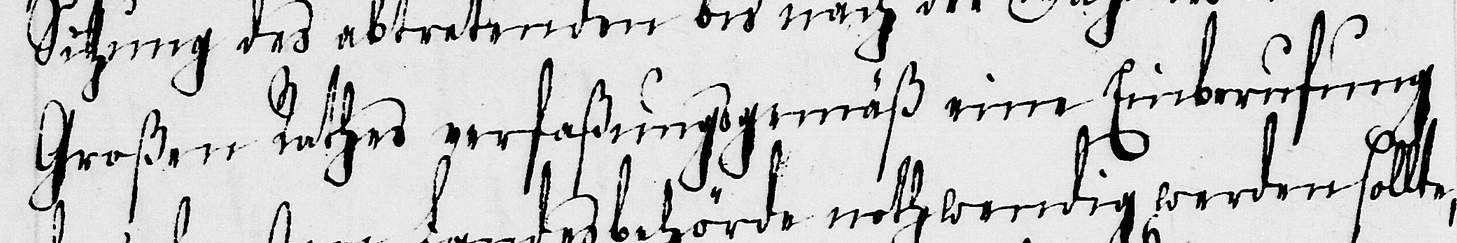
Großen Rathes verfaßungsgemäß eine Einberufung
